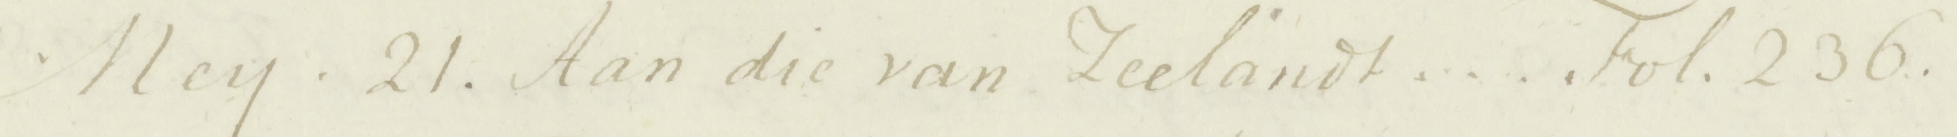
Mey. 21. Aan die van Zeelandt.... Fol. 236.
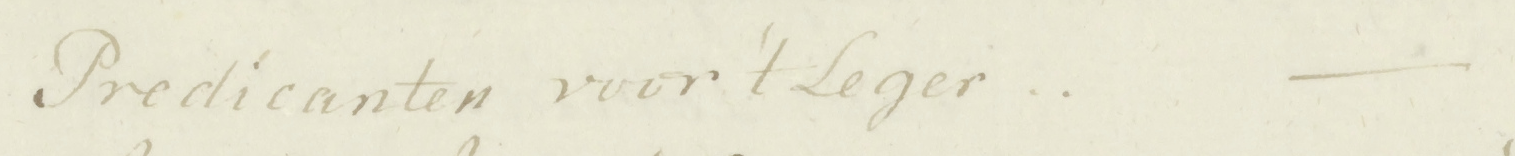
Predicanten voor ‛t Leger.. —
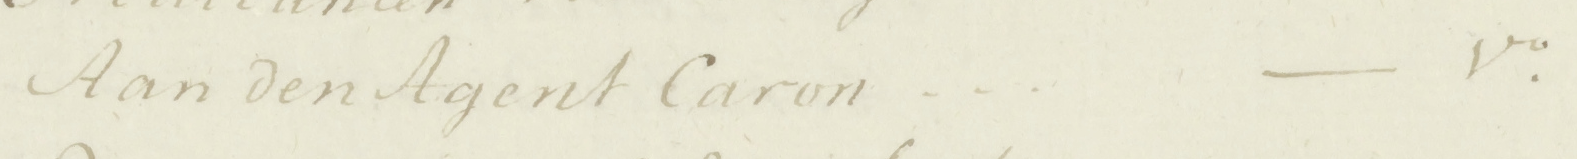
Aan den Agent Caron ...— Vo.
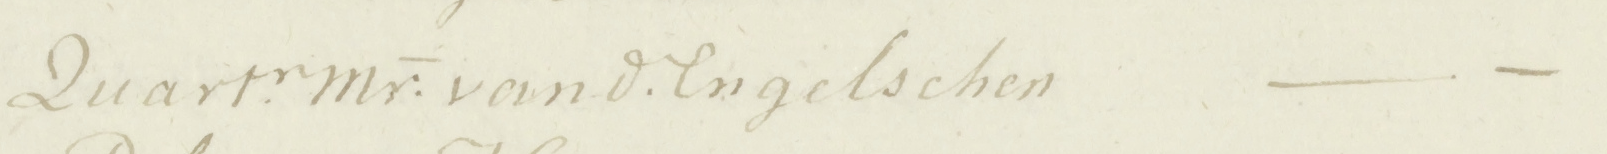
Quartr.Mr. van d. Engelschen — -
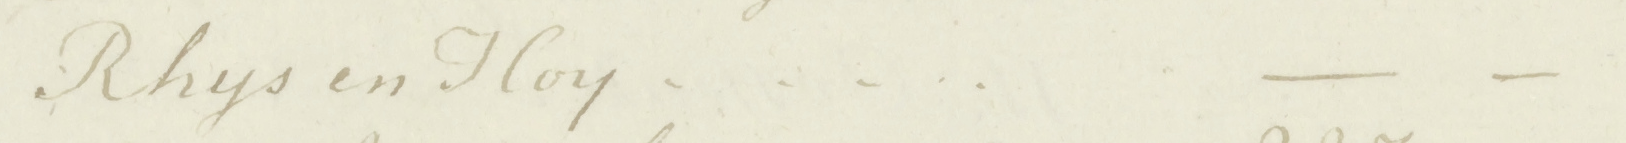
Rhyes en Hoy ....— -
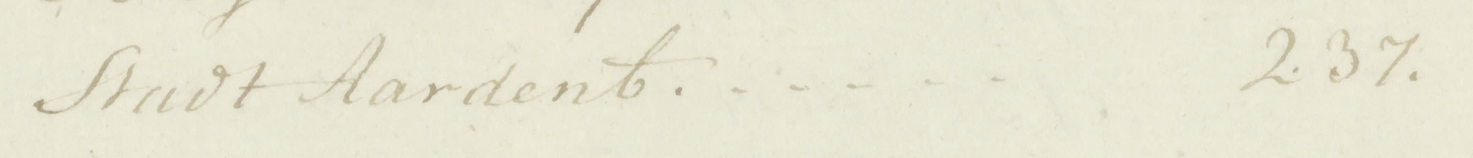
Stadt Aardenb...... 237.
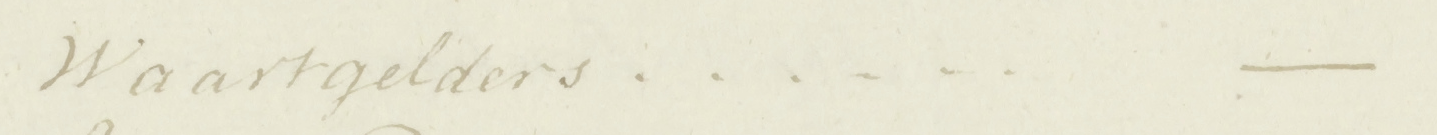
Waartgelders...... —
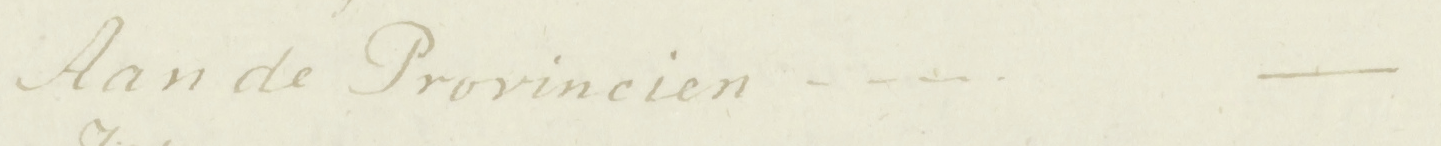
Aan de Provincien..... —
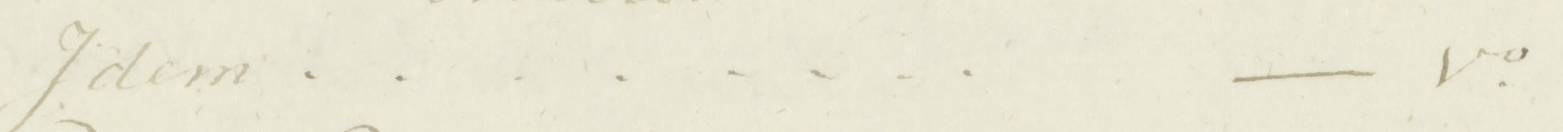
Idem ........— Vo.
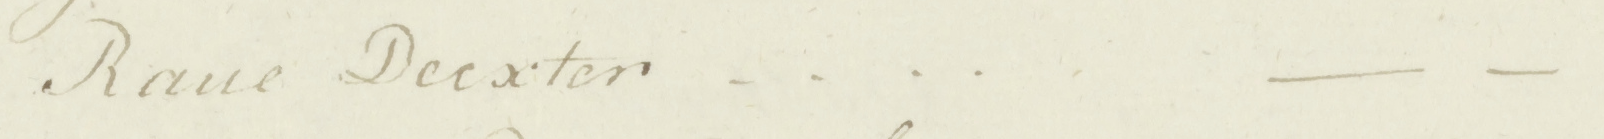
Raue Decxter.....— -
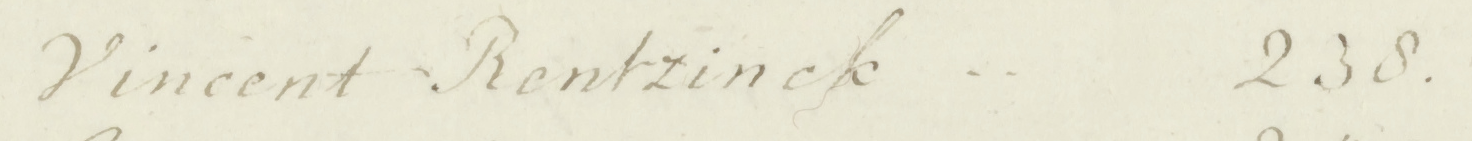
Vincent Rentzinck.. 238.
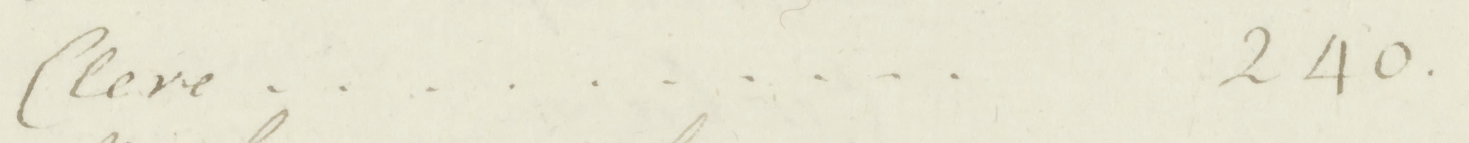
Cleve..........240.
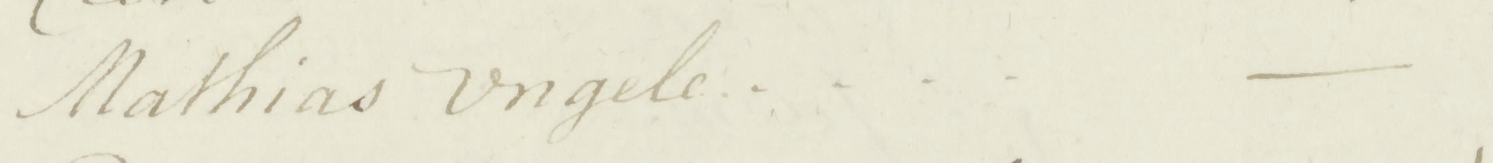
Mathias ungele.... —
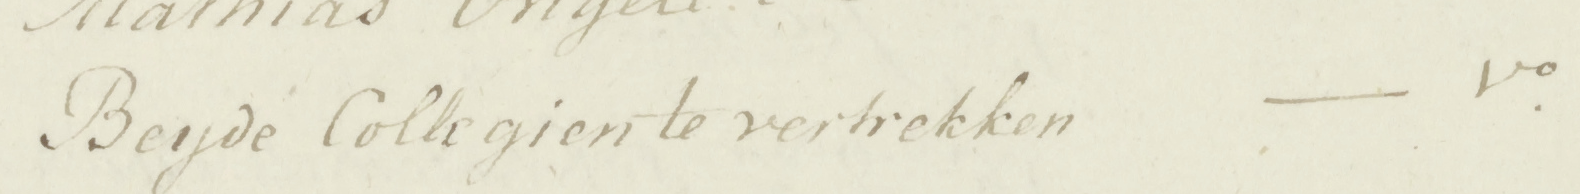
Beyde Collegien te vertrekken — Vo.
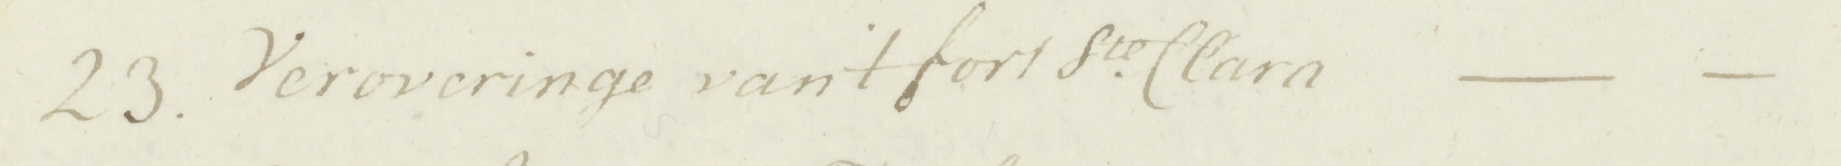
23. Veroveringe van‛t fort Ste Clara — -
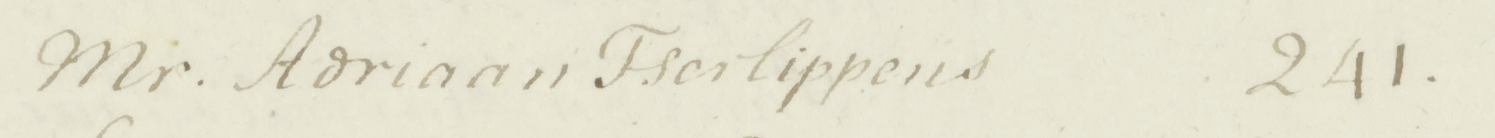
Mr. Adriaan Tserlippens 241.
